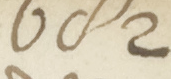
682
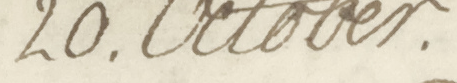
20. October
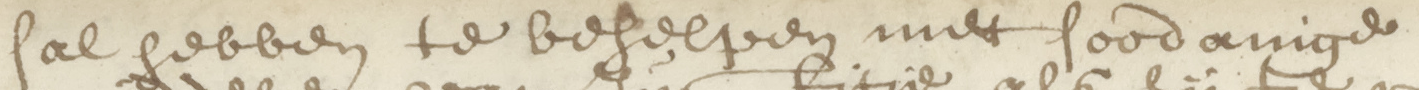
sal hebben te behelpen met soodanige
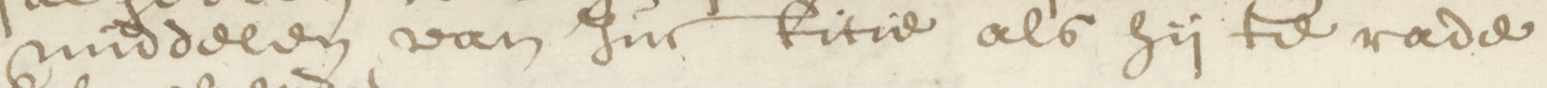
middelen van Justitie als hij te rade
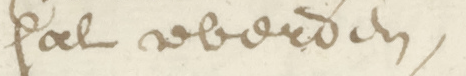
sal werden.
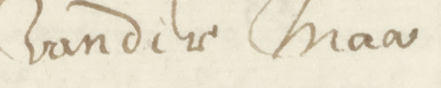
Van der Maa
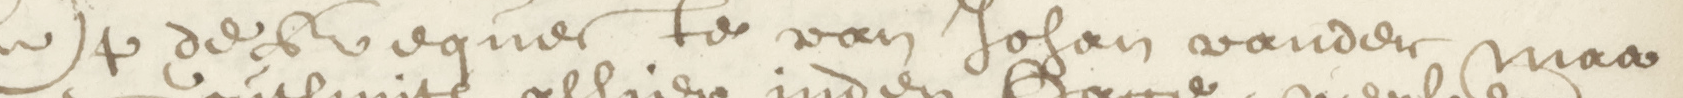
Op de Requeste van Johan vanden Maa
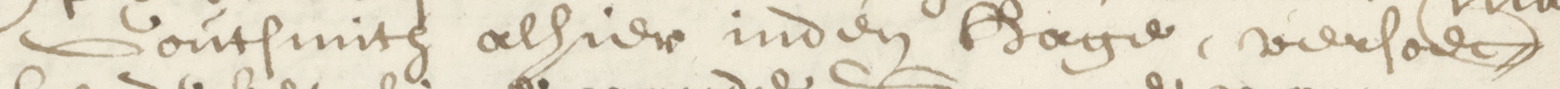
Goutsmith alhier inden Hage, versoec„
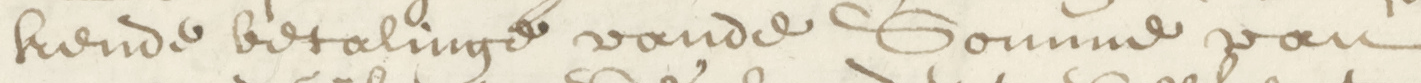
kende betalinge vande Somme van
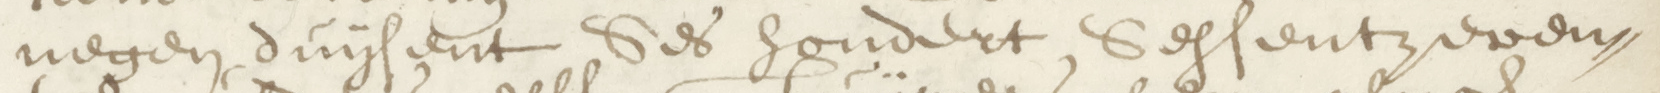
negen duijsent Ses hondert sessentzeven„
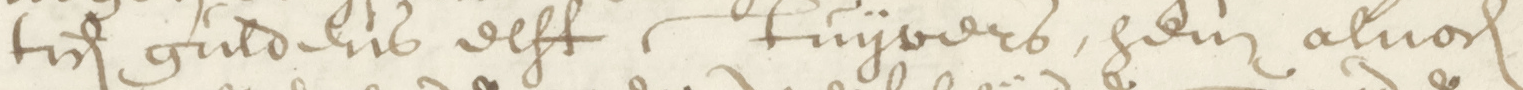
tich guldens elff stuijvers, hem alnoch
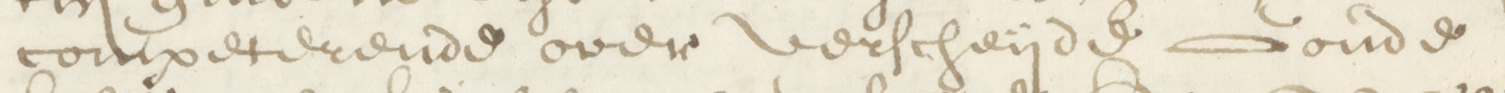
competerende over verscheijde Goude
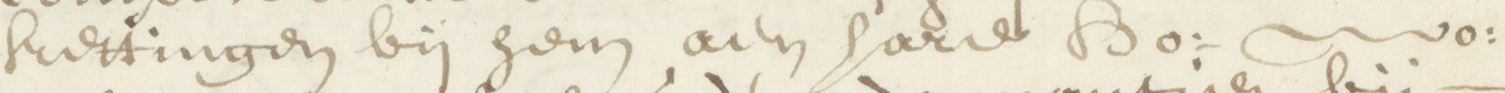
kettingen bij hem aen hare Ho:Mo:
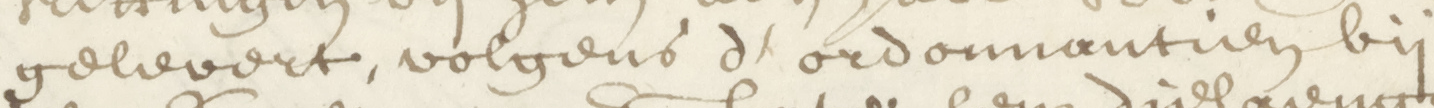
gelevert, volgens d'ordonnantien bij
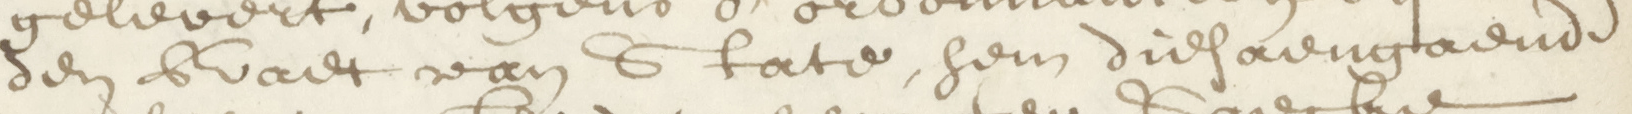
den Raet van State, hem diesaengaende
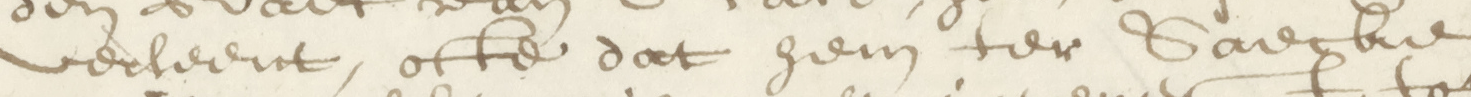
verleent, ofte dat hem ter Saecke
